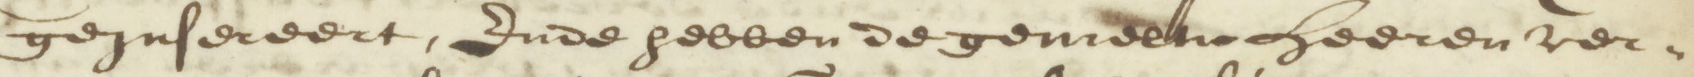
geinsereert. Ende hebben de gemelte Heeren ver„
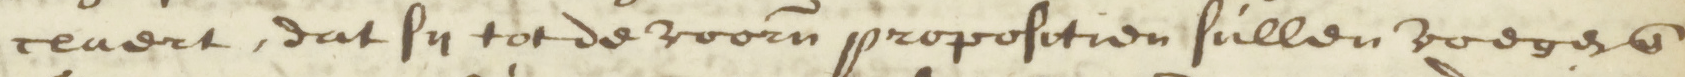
claert, dat sy tot de voorn propositien sullen voegen en
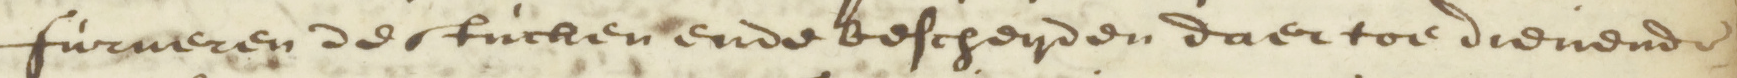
furneren de stucken ende bescheyden daer toe dienende
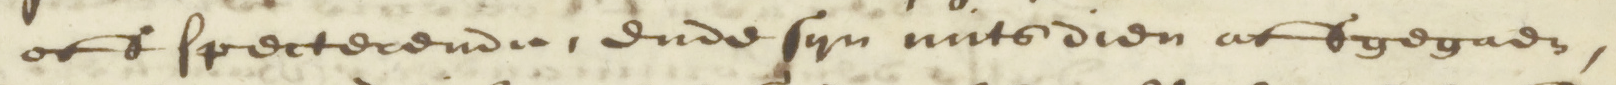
off specterende, ende syn mitsdien affgegaen,
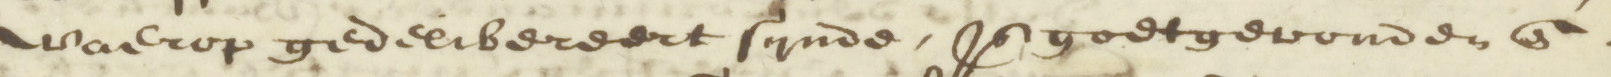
Waerop gedelibereert synde, Is goetgevonden en —
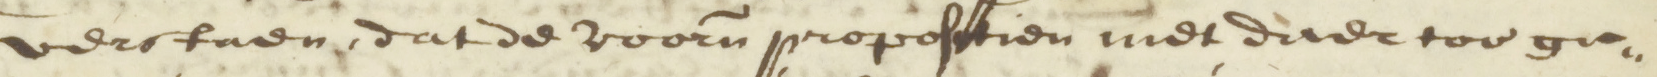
verstaen, dat de voorn propositien met daer toe ge„
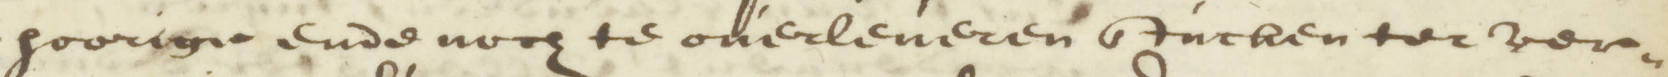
hoorige ende noch te overleveren stucken ter ver„
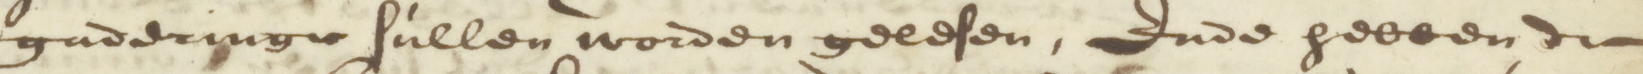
gaderinge sullen worden gelesen. Ende hebben de
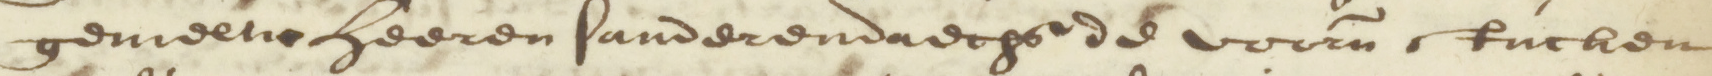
gemelte Heeren sanderendaechs de voorn stucken
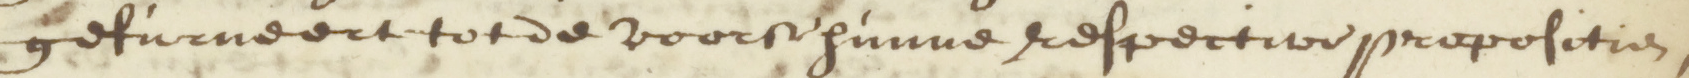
gefurneert tot de voorsz hunne respective propositien.
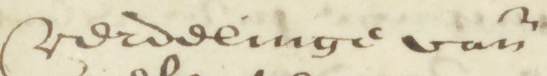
Verdelinge van
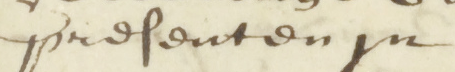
presenten in
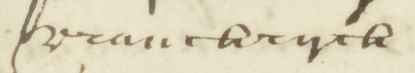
vranckryck
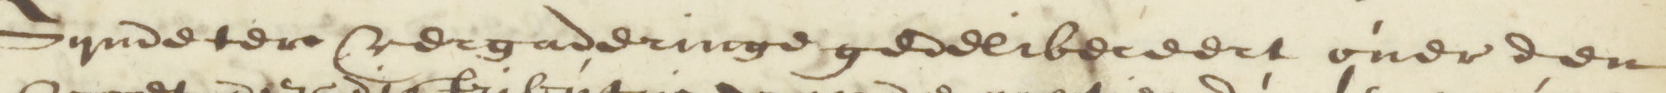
Synde ter vergaderinge gedelibereert over den
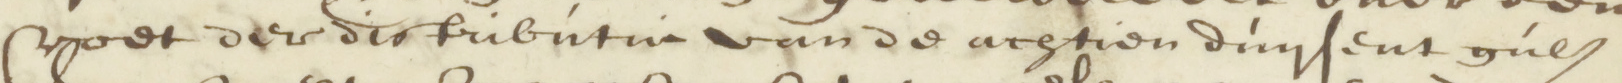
voet der distributie van de achtien duysent gul
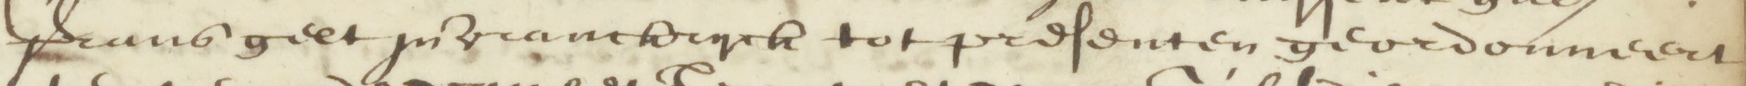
Frans gelt in vranckryck tot presenten geordonneert
